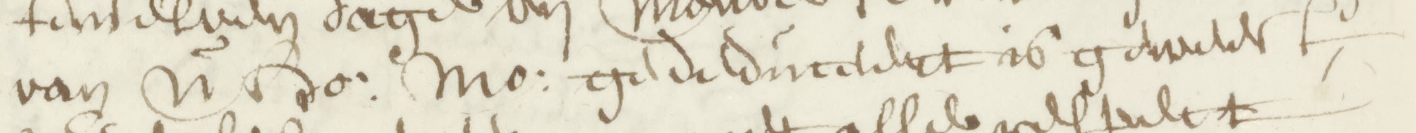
van U Ho:Mo: gededuceert is geweest,
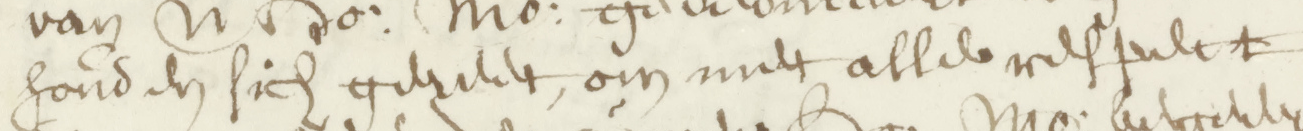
houden sich gereet, om met alle respect
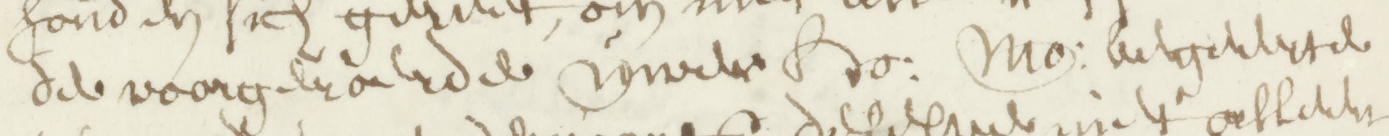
de voorgeroerde Uwer Ho:Mo: begeerte
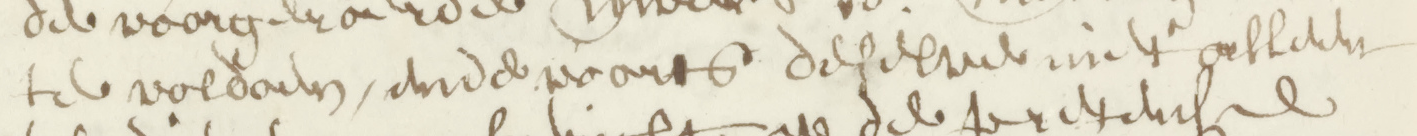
te voldoen, ende voorts deselve niet alleen
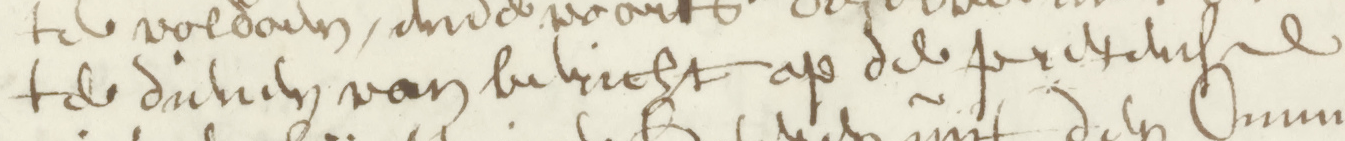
te dienen van bericht op de pretense
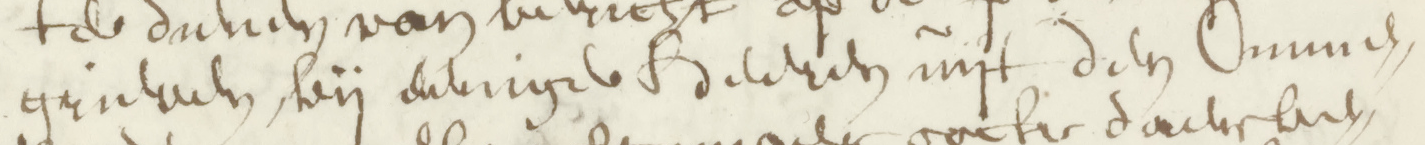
grieven, bij eenige Heeren uijt den Omme,
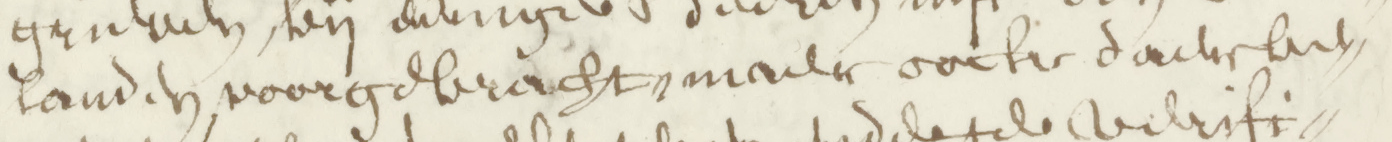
landen voorgebracht, maer oock daerbe„
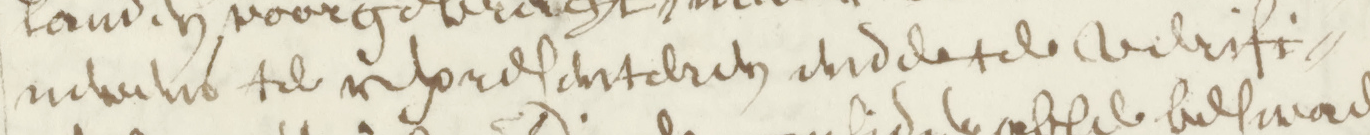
nevens te representeren ende te verifi,,
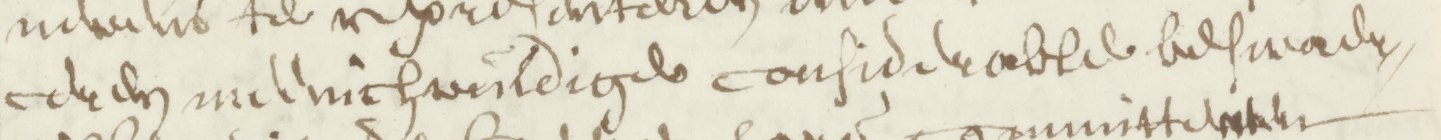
ceren meenichvuldige considerable beswaer,,
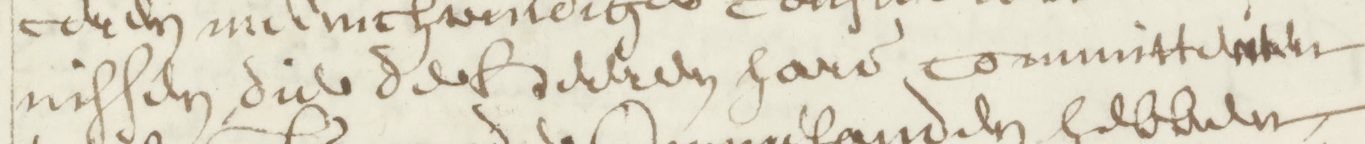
nissen, die de Heeren hare committenten
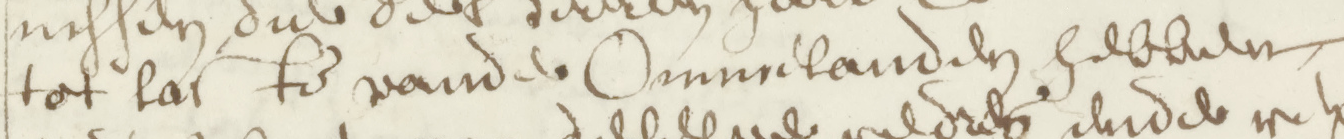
tot laste vande Ommelanden hebben,
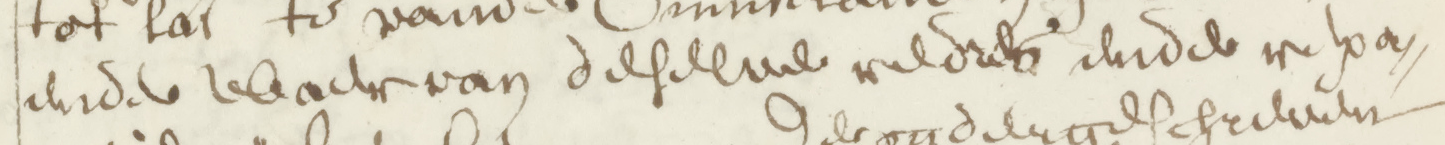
ende waervan deselve redres ende repa,,
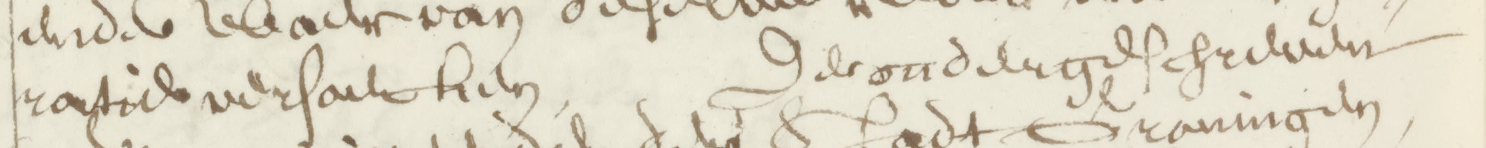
ratie versoecken. De ondergeschreven
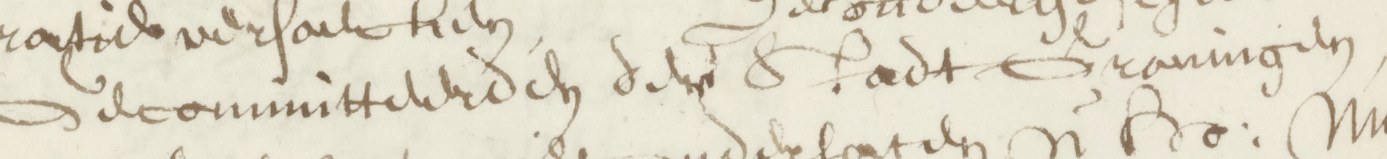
Gecommitteerden der Stadt Groningen
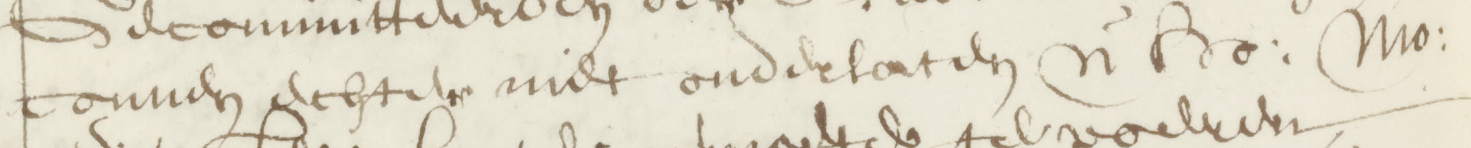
connen echter niet onderlaten U. Ho:Mo:
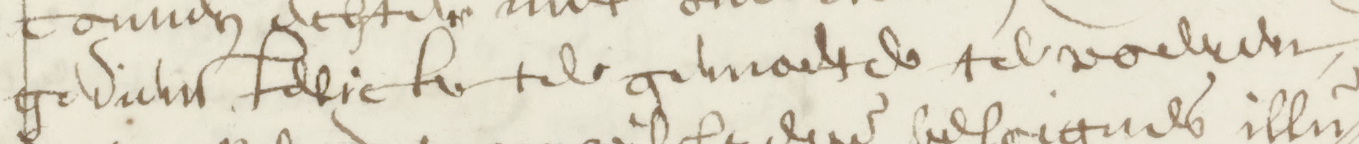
gedienstelick te gemoete te voeren,
